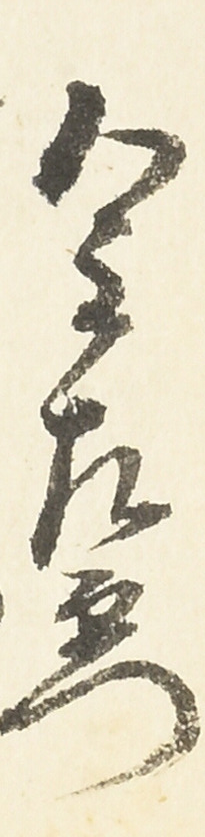八百右衛門
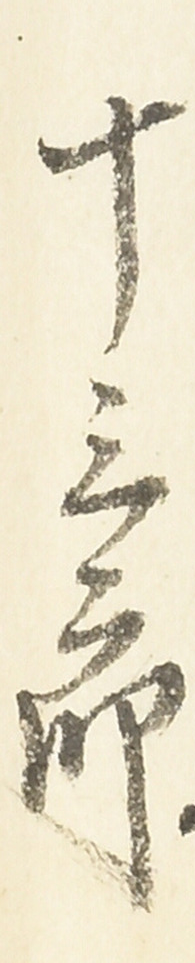十三郎
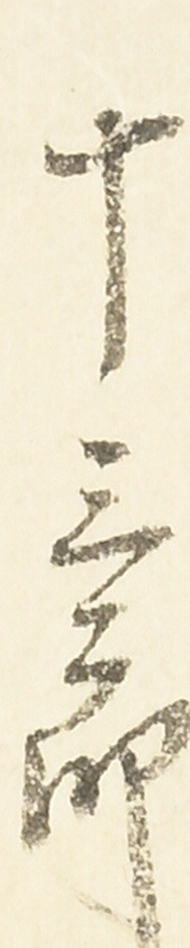十三郎
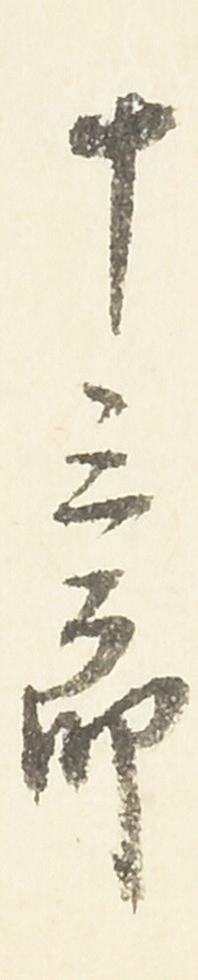十三郎
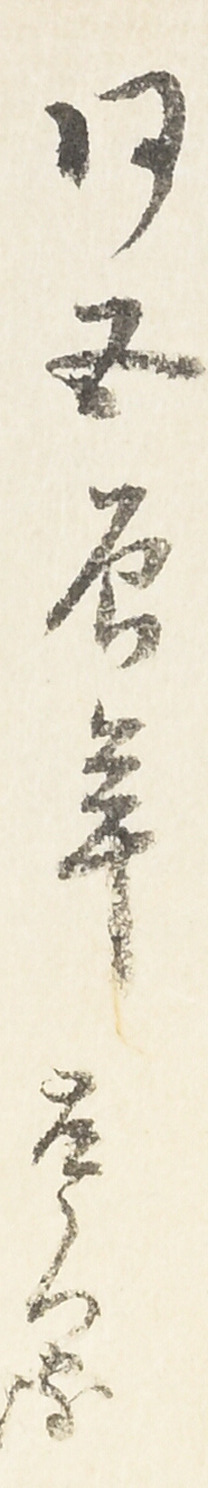同五辰年十三郎
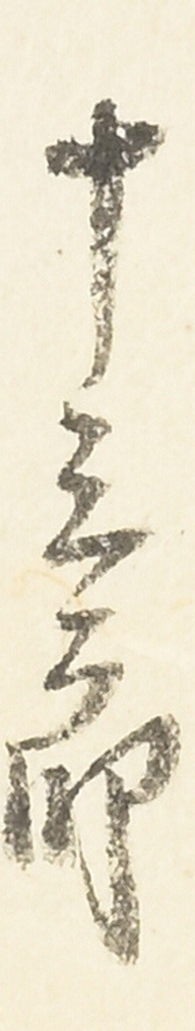十三郎
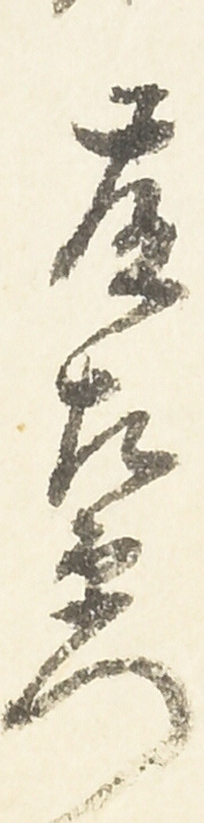藤右衛門

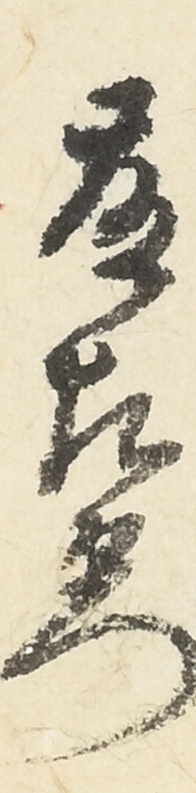藤左衛門
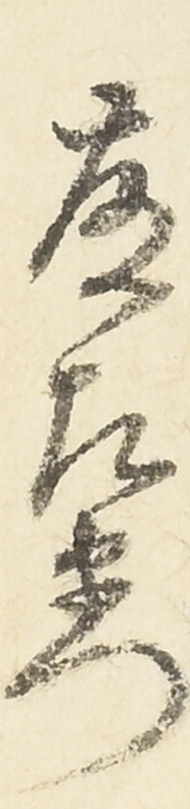藤左衛門
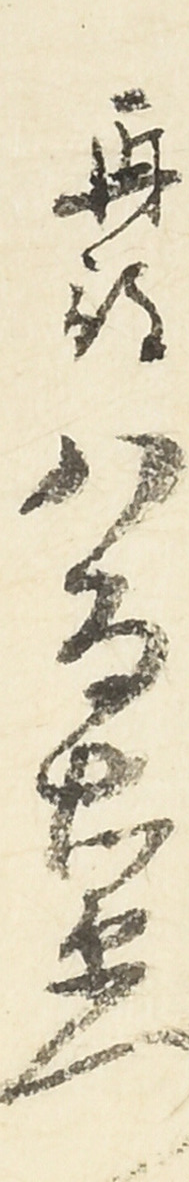再役八百右衛門
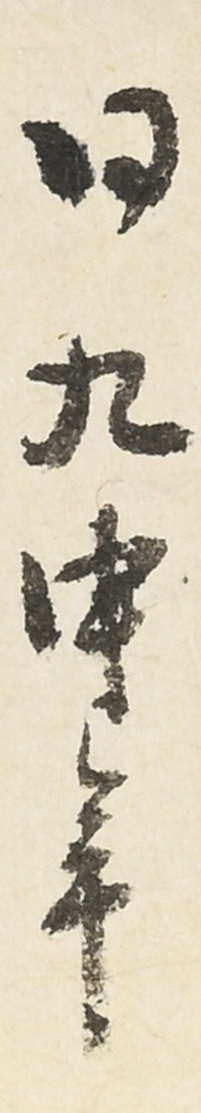同九申年
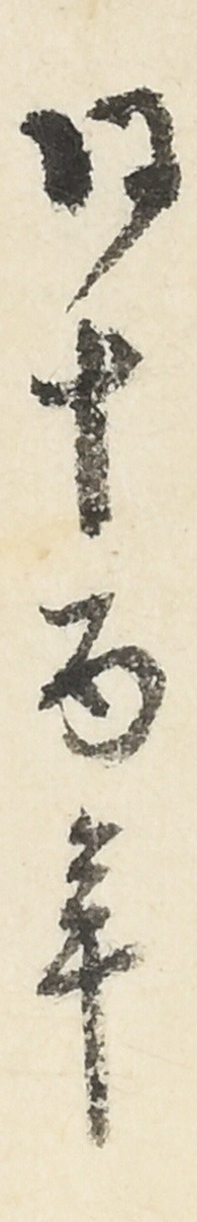同十酉年
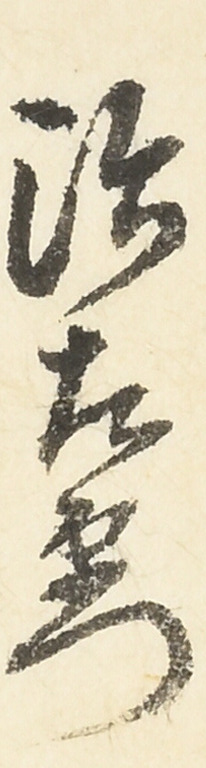藤左衛門
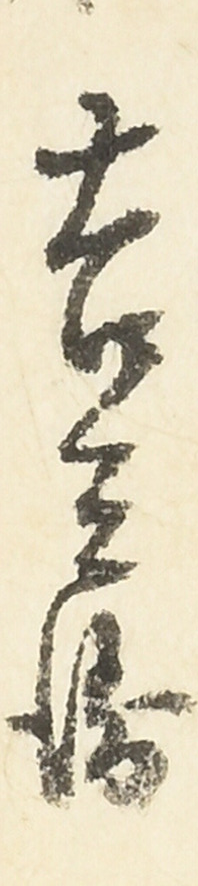吉兵衛
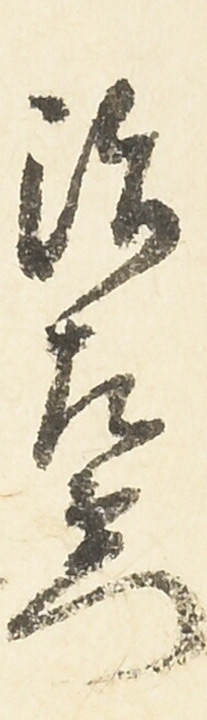藤左衛門
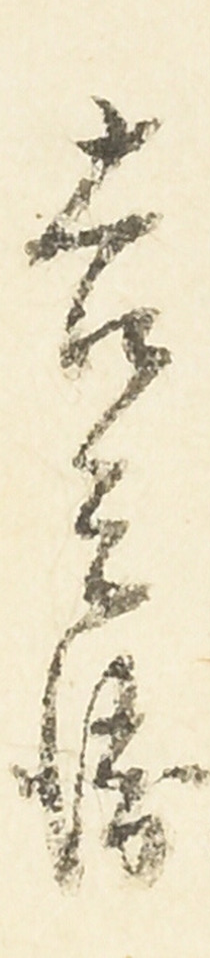吉兵衛
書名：鉾持町丁代勤役年歴順控
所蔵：伊那市立高遠町図書館・合同会社AMANE
